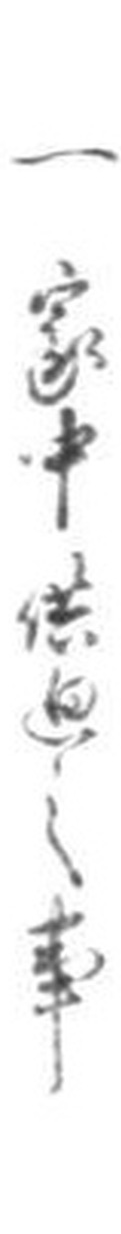一家中供廻之事
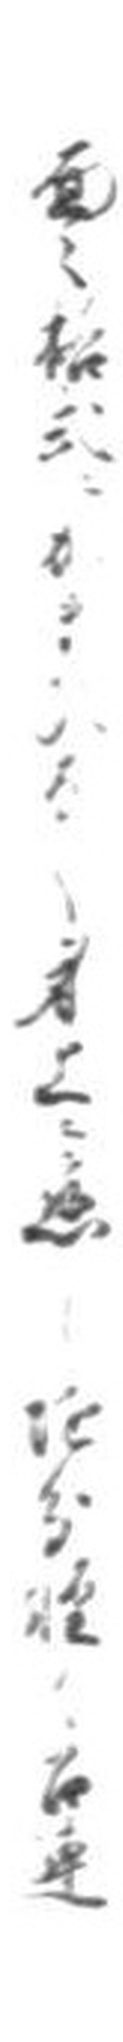面々格式ニかまひなく身上ニ応し随分軽く召連
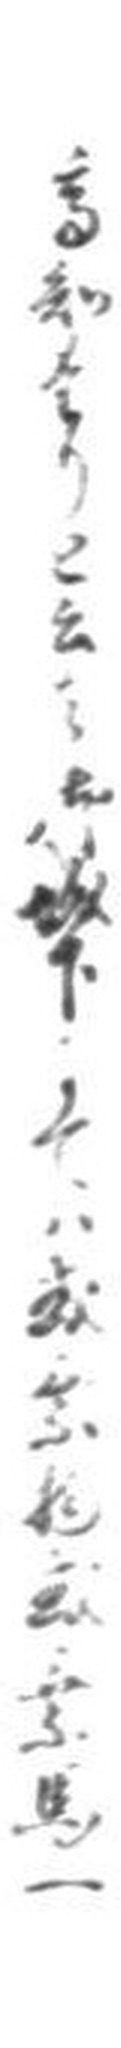高知たりと云共御城下にてハ或乗物或乗馬一
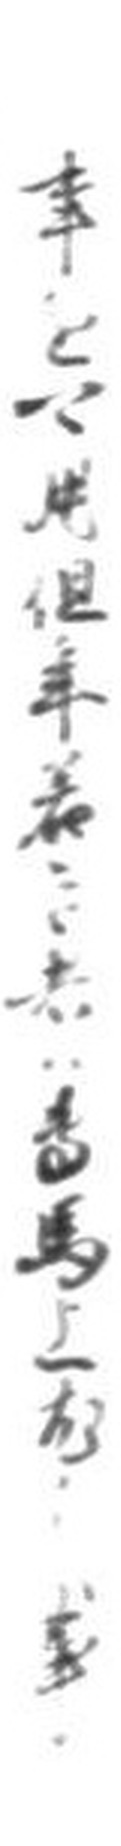事を可用但年若き候者ハ専馬上尤之事
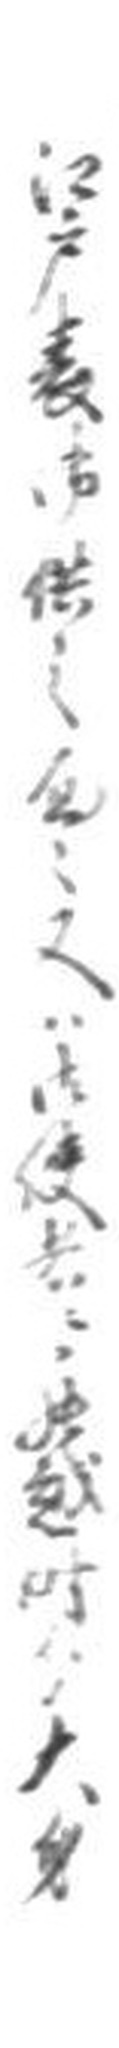江戸表御供之面々又ハ御使者ニ罷越時分大身
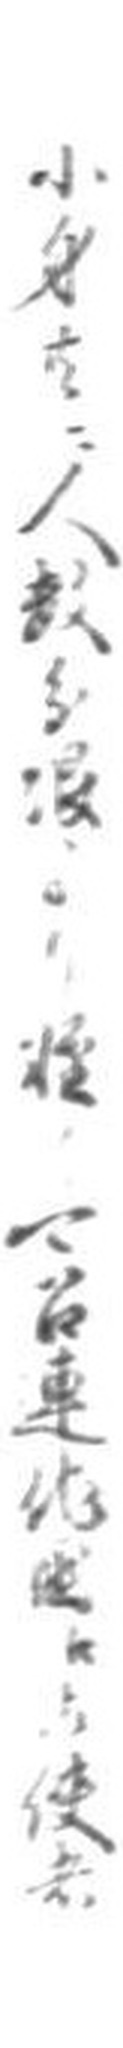小身共ニ人数分限より軽く可召連他国江御使者
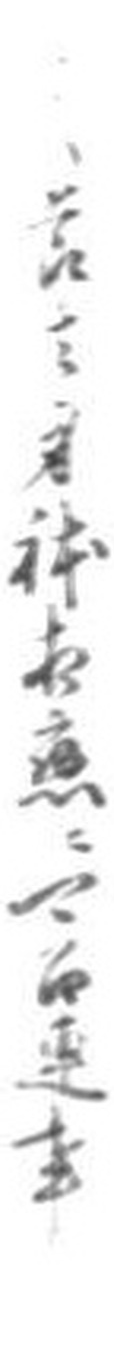之節者身躰相応ニ可召連事
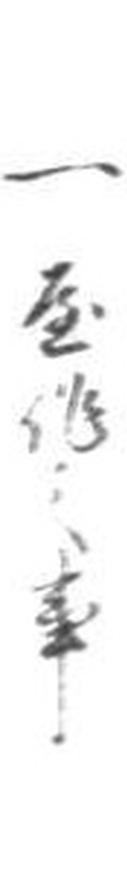一屋作之事
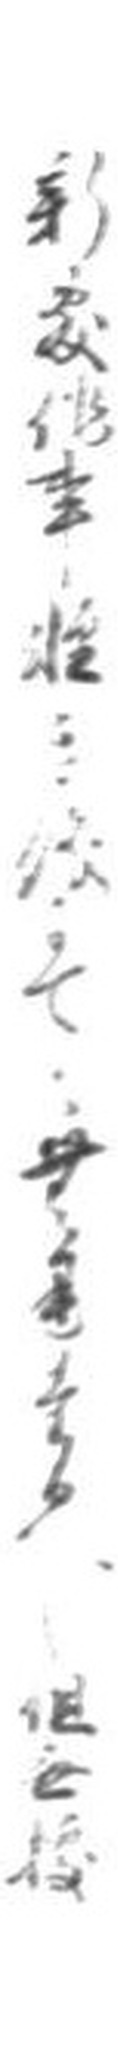新敷作事軽き儀にても無用たるへし但無拠
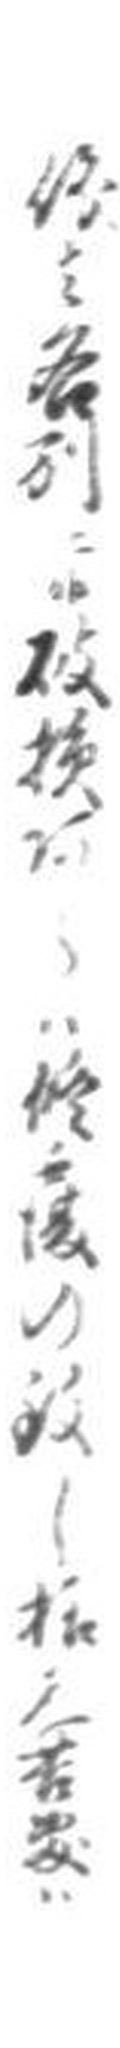儀者各別ニ候破損あらハ修覆の致し様見苦敷ハ

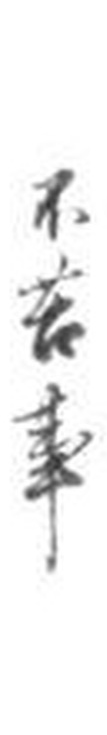不苦事
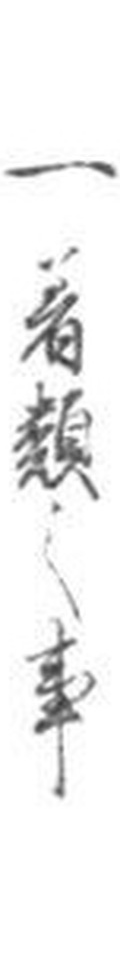一着類之事
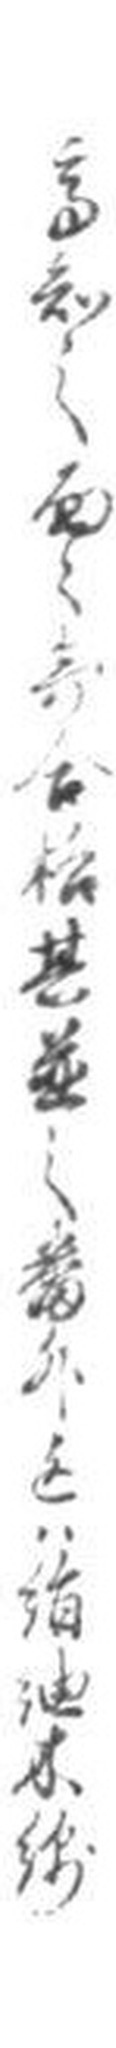高知之面々寄合格其並之番外迄ハ絹紬木綿
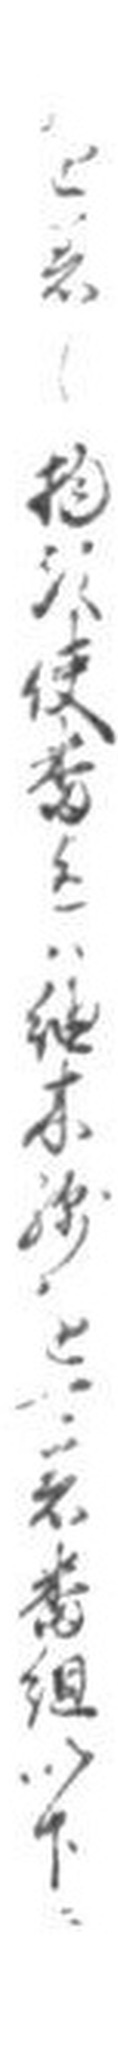を着し物頭使番迄ハ紬木綿を可着番組以下ニ
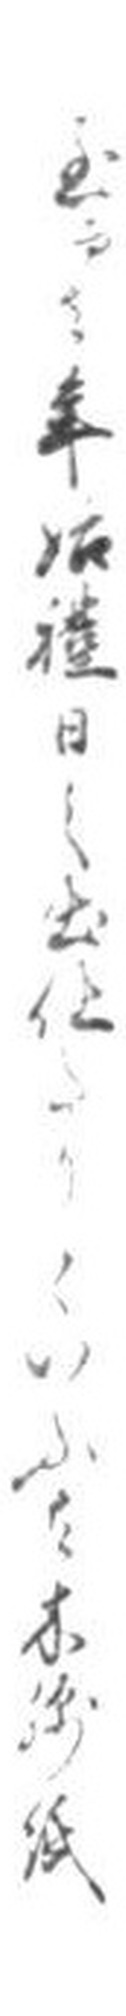至而者年始礼日之出仕たりといふ共木綿紙
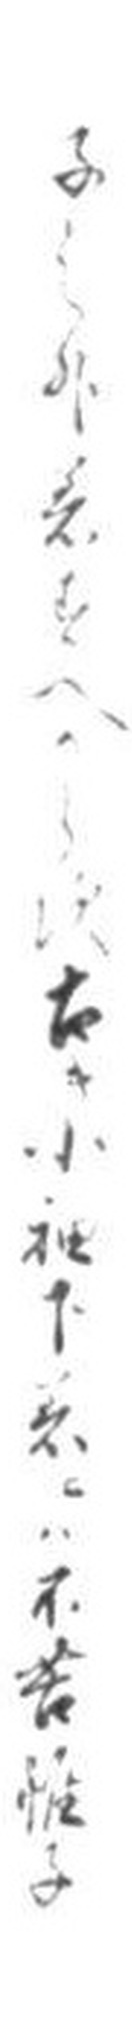子之外着すへからす古キ小袖下着ニハ不苦帷子
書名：家譜 三十八 宗矩公 従享保九年五月到享保九年十二月
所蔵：福井県文書館 Fukui Prefectural Archives
